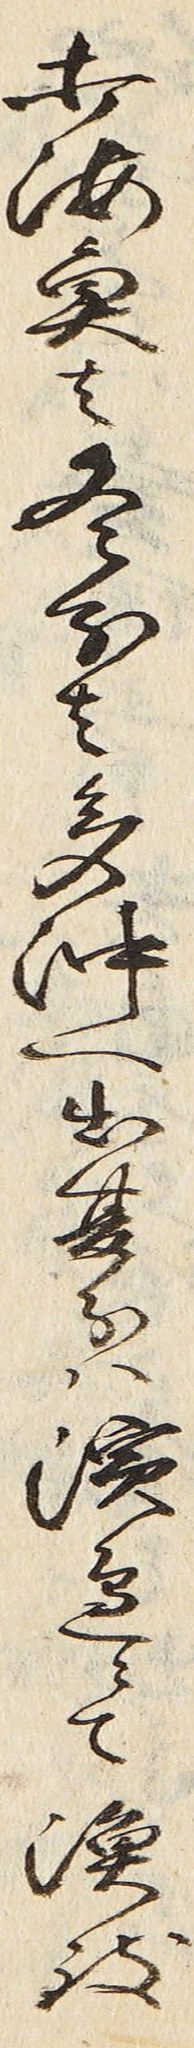打海魚は冬分は多沖へ出夏分は浜辺にて漁致
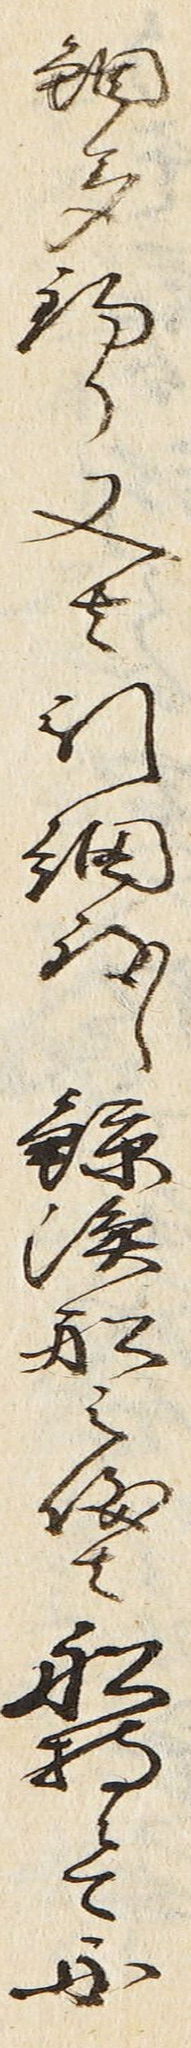鯛多釣り又は引網致し鯨漁船之儀は船持にて舟
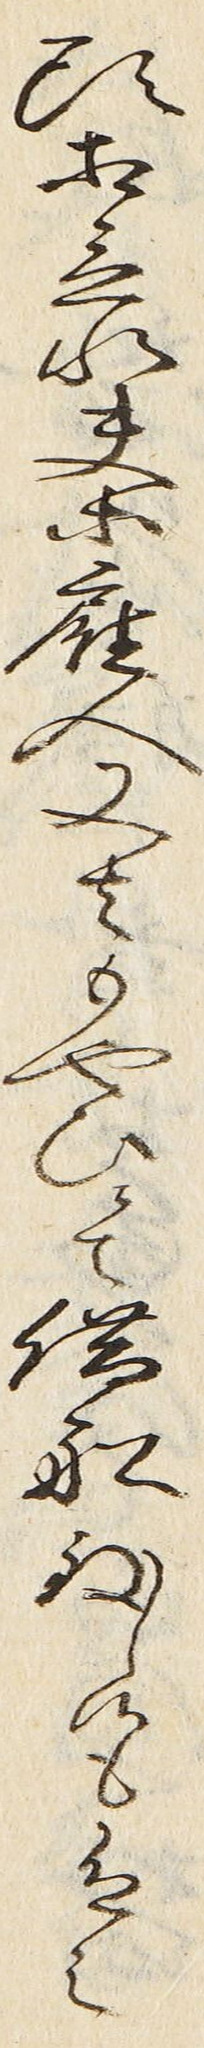頭相立水主等雇入又はもやひにて借船致し候も有之
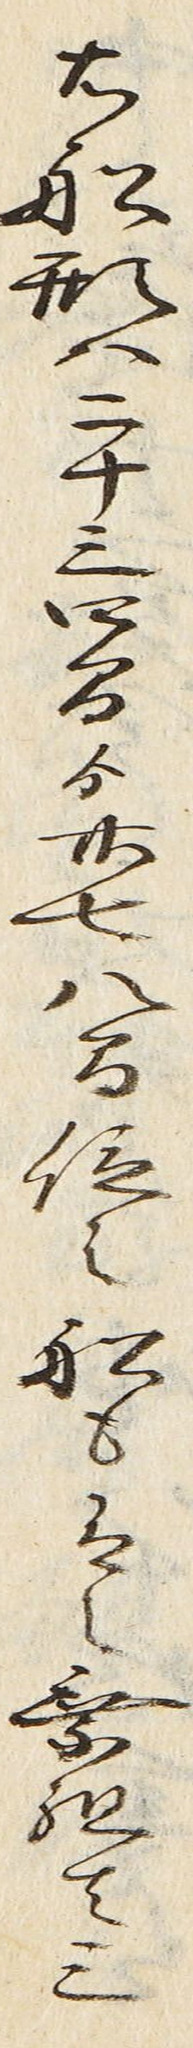右船形は二十三四間ゟ廿七八間位之船も有之乗組は三
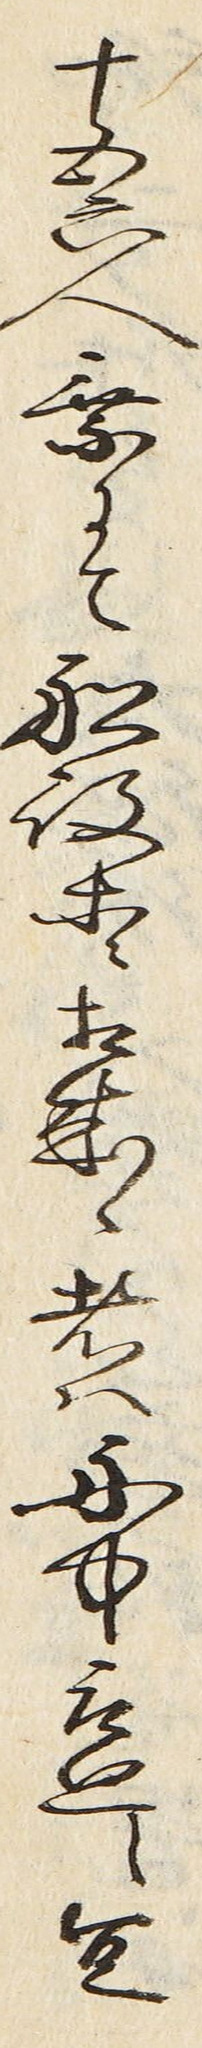十五六人乗にて船役等に相成候者は舟中取廻し宜
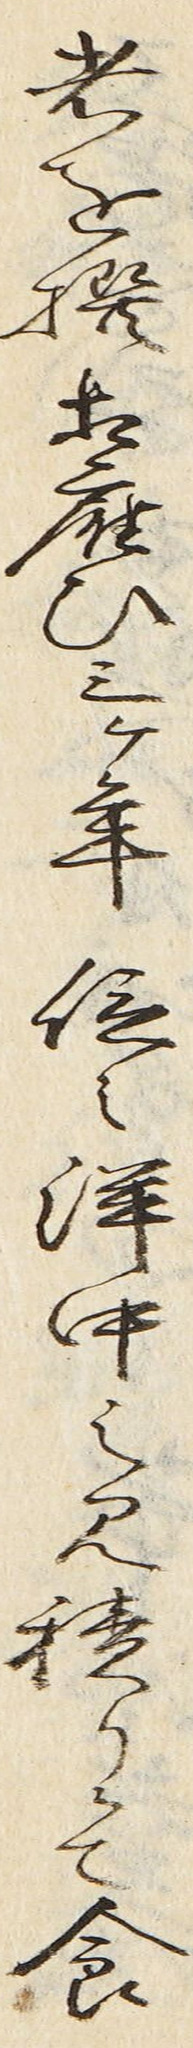者を撰相雇ひ三ヶ年位之洋中之見積りにて食
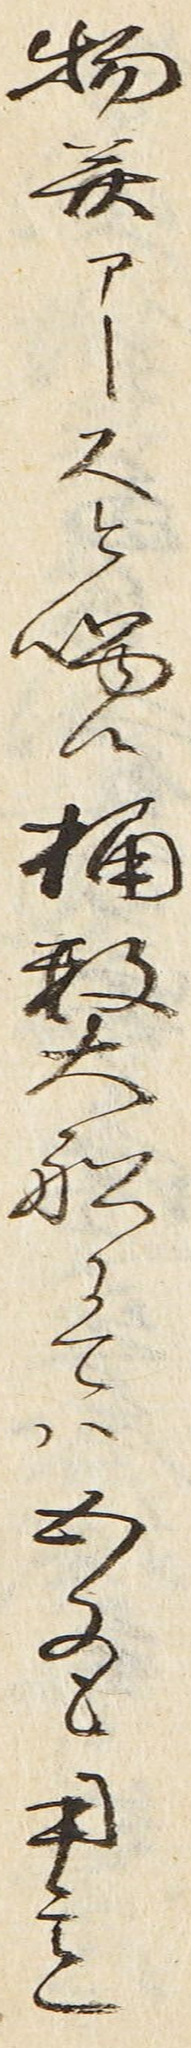物并アースと唱候桶数大船にては五にも用意
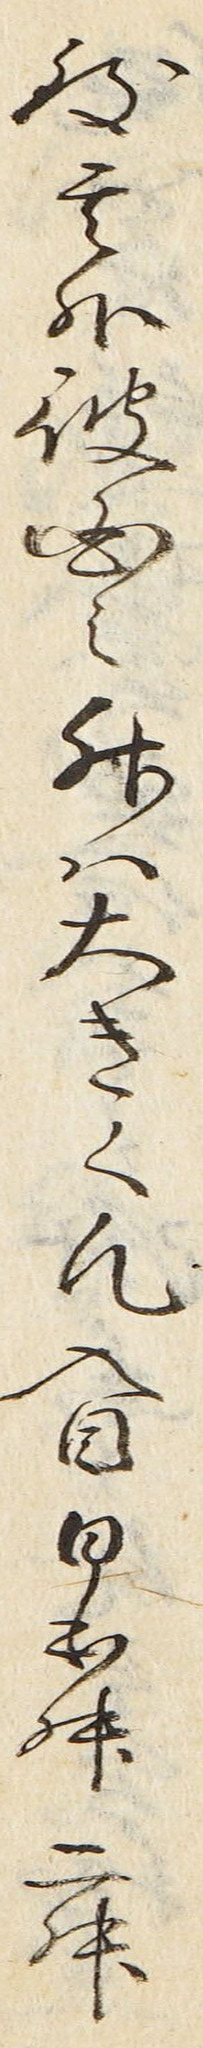致其外彼国之升は大きく凡入目日本升二升
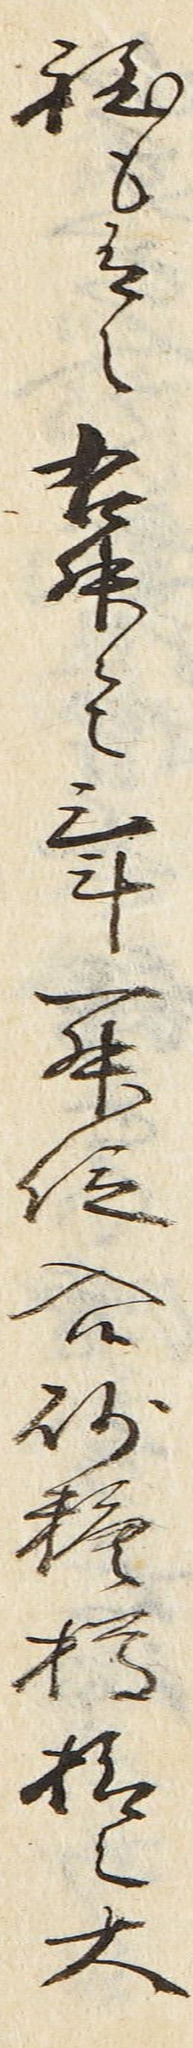程も有之右升には三斗一升位入候砂糖樽様之大
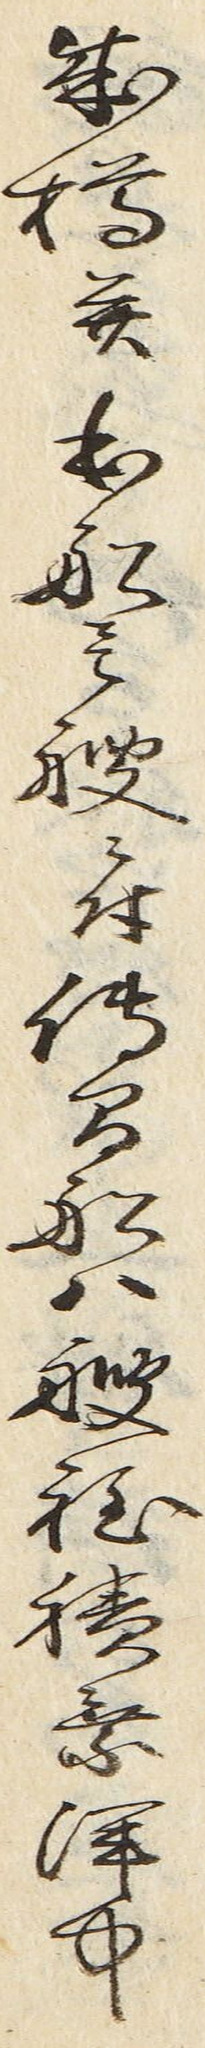成樽并本船壱艘に付伝間船八創艘程積乗洋中

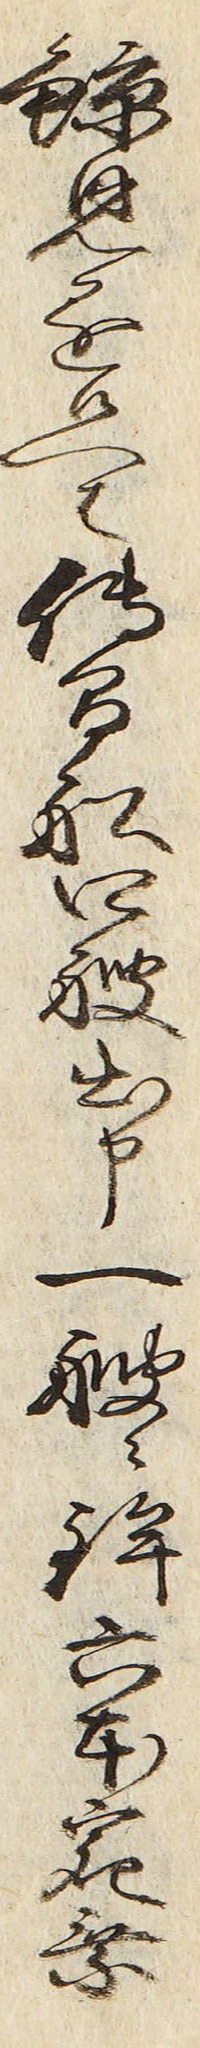鯨見懸候へは伝間船四艘出申一艘に鉾六本宛乗
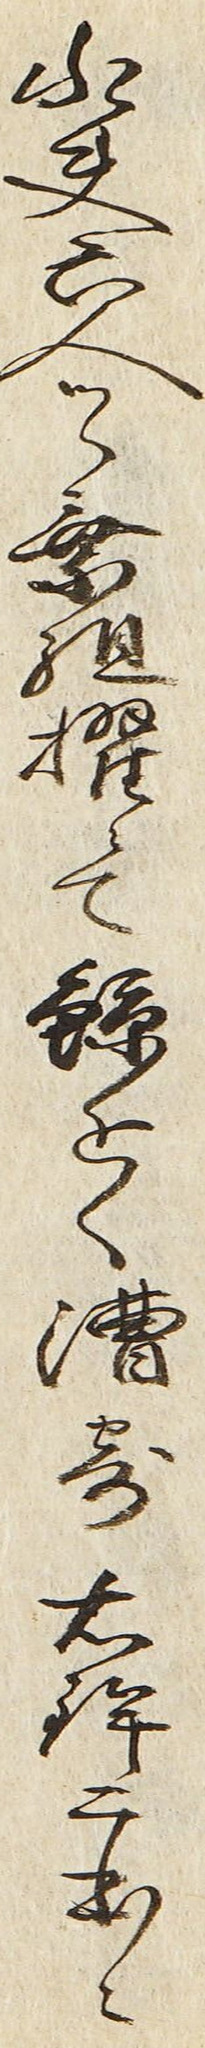水主六人ツヽ乗組櫂にて鯨近く漕ぎ寄右鉾二本に
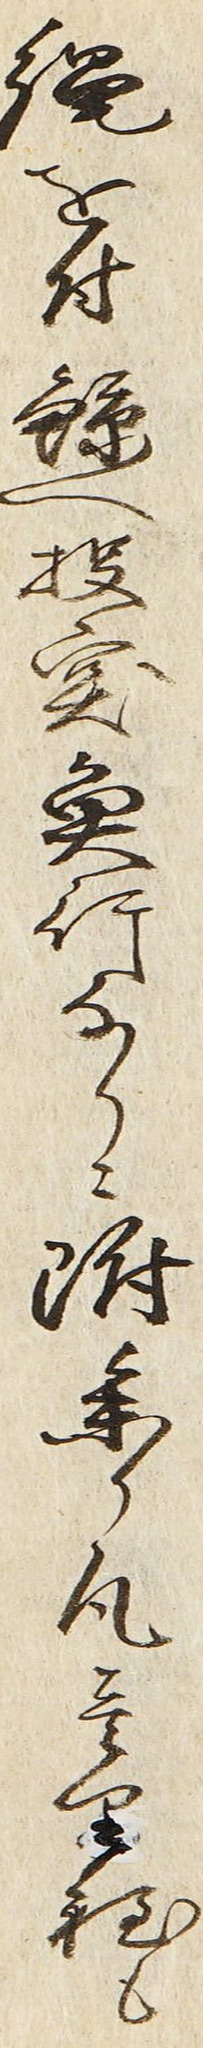縄を付鯨へ投突魚行なりに附参り凡壱里程も
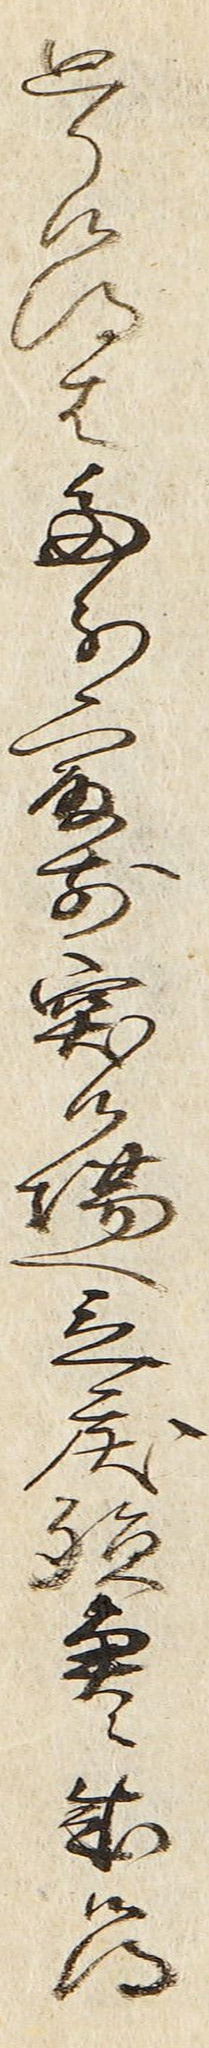廻り候得は多分最前突候場へ立戻殞魚に成候得
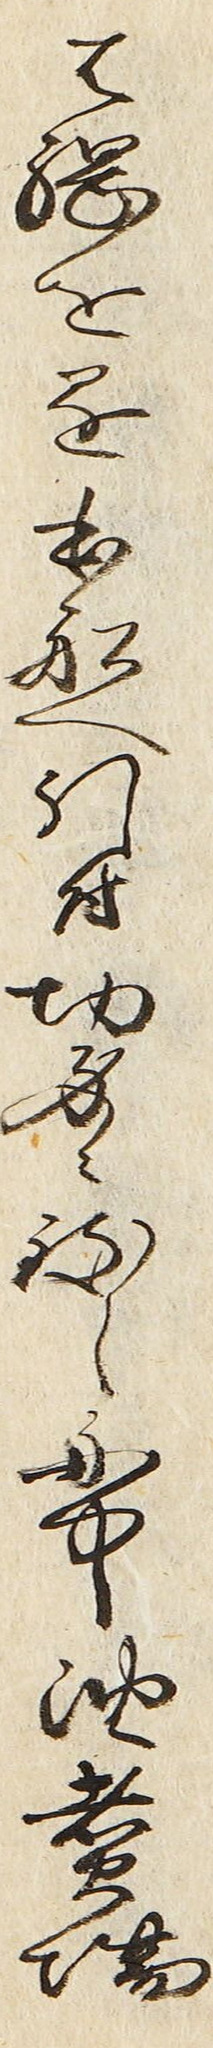は綱を懸本船へ引付切身に致し舟中油煮場
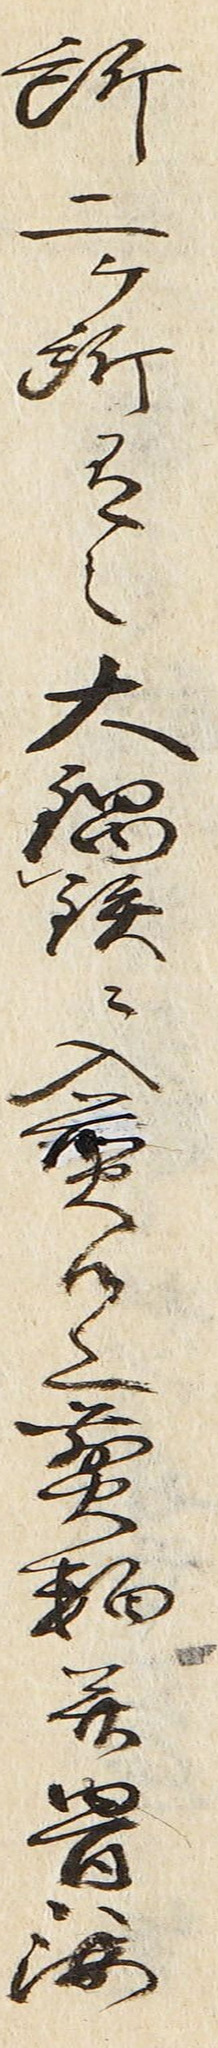所二ヶ所有之大鍋鉄に入煎候上煎粕并骨は海
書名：土佐中浜万次郎漂流記
